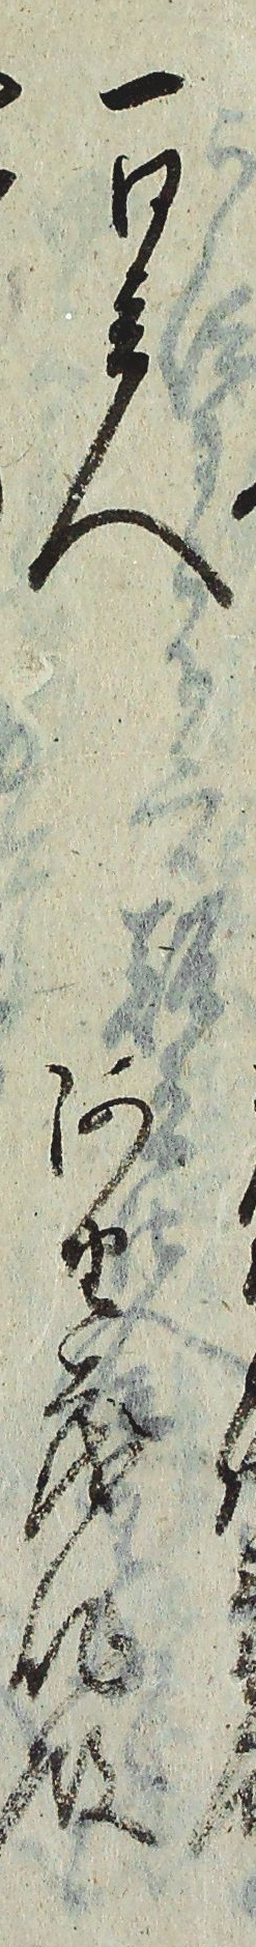一同壱人河野茂作殿
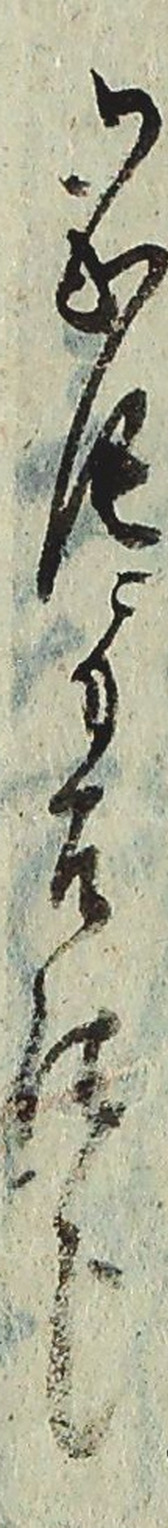御出張に付召仕申候
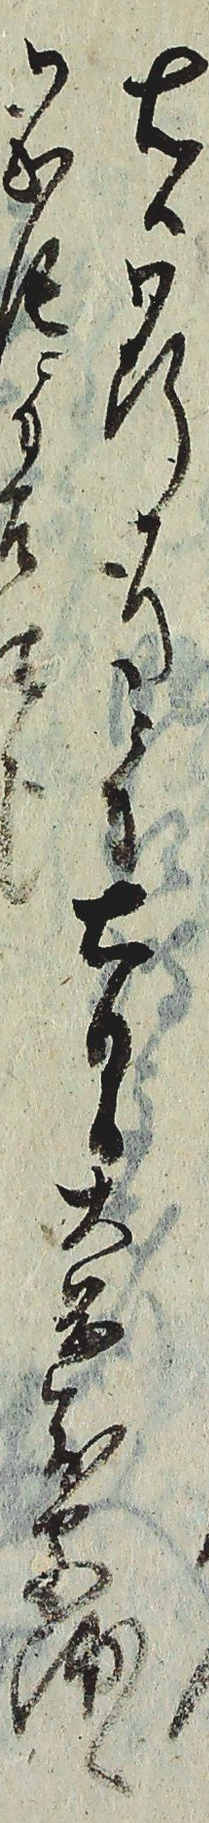右は同断御用に付七月日大岡別宮浦へ
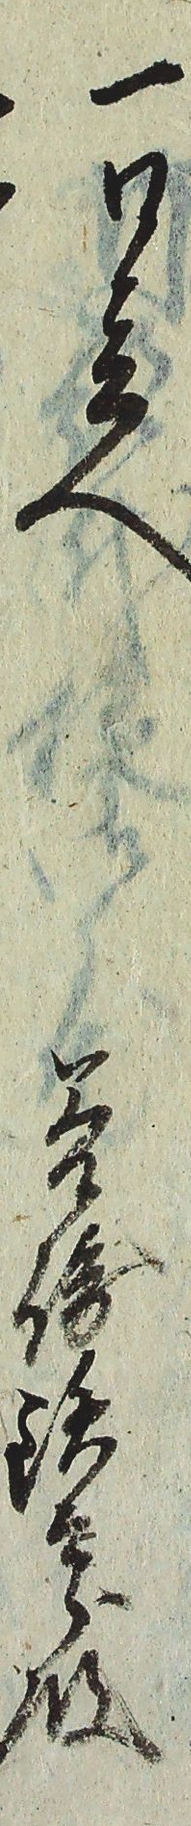一同壱人谷崎鉄太郎殿
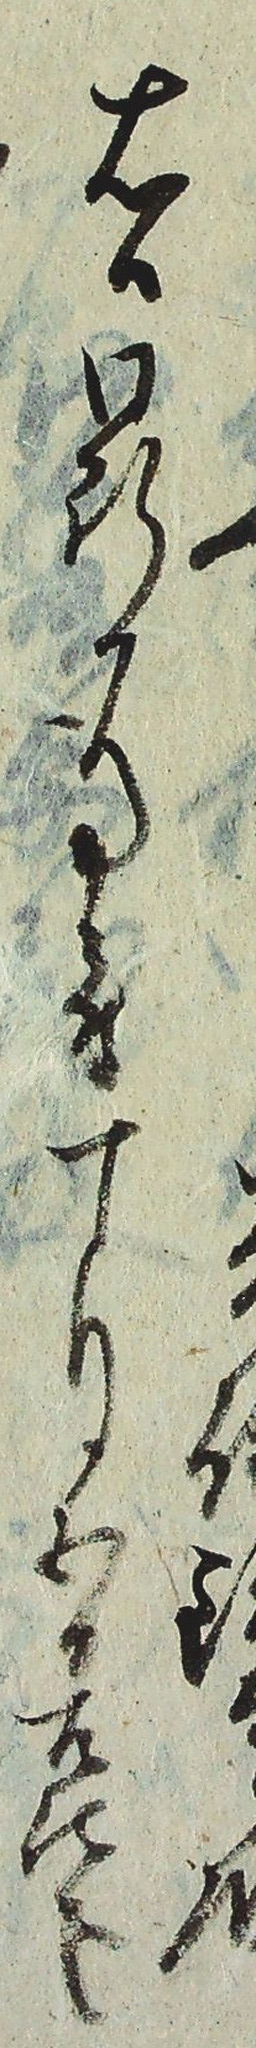右は同断御用に付十月五日召仕申候
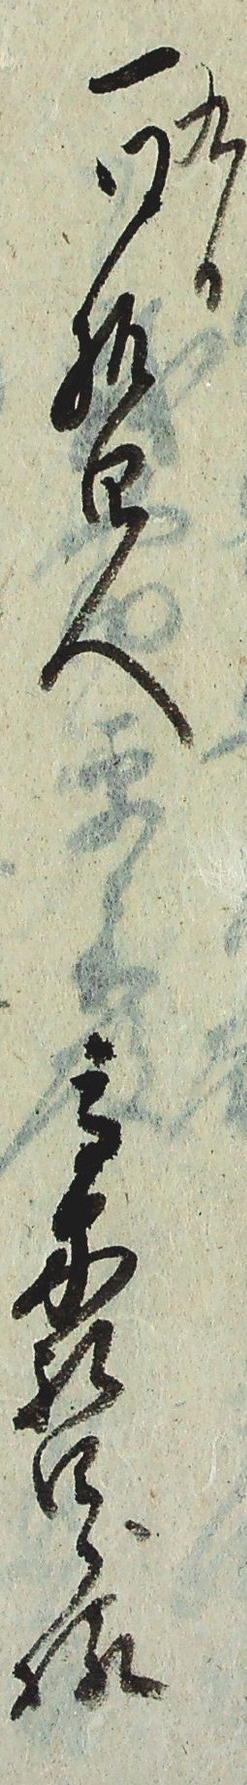一同拾四人高木新四郎様
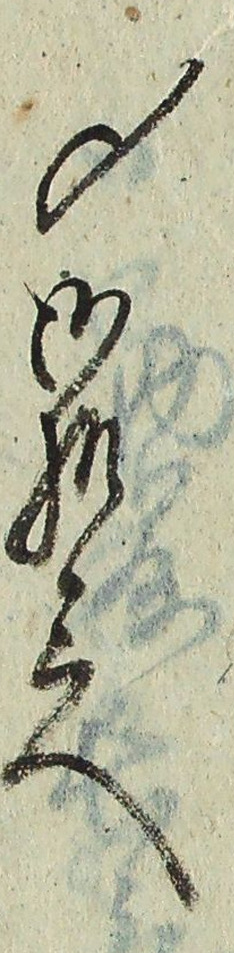〆弐拾三人
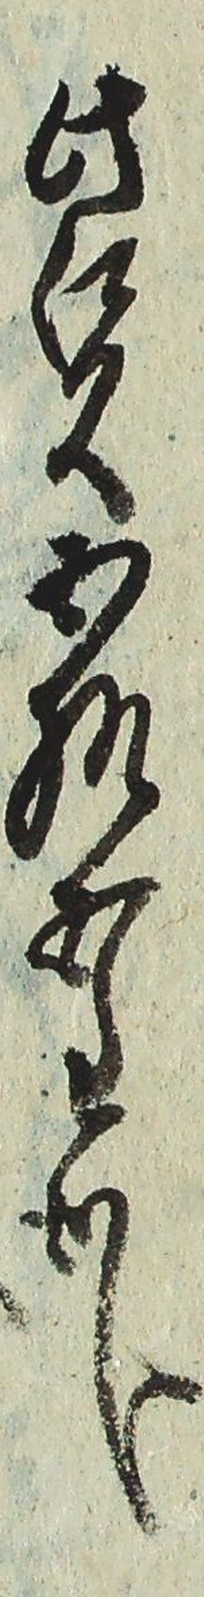此賃五拾五匁弐分
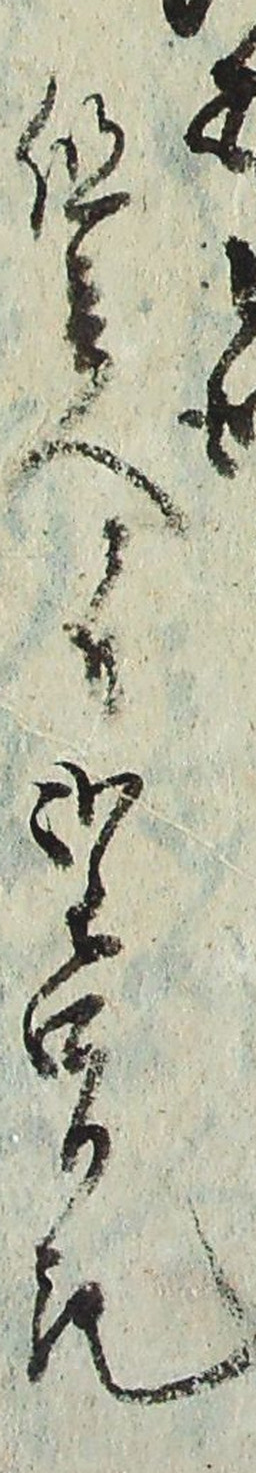但壱人に付弐匁四分宛

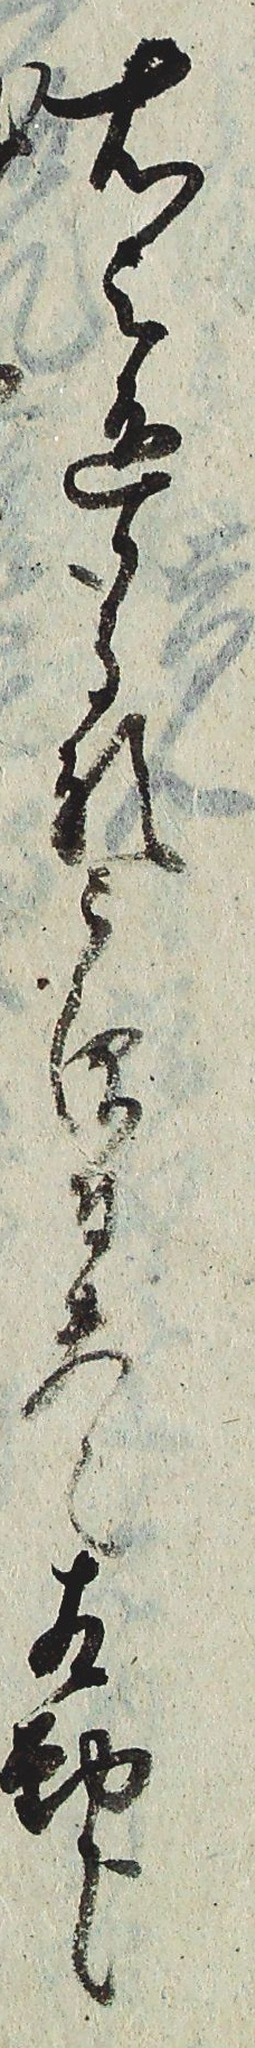右之通御手形被仰付夫々相勤申候
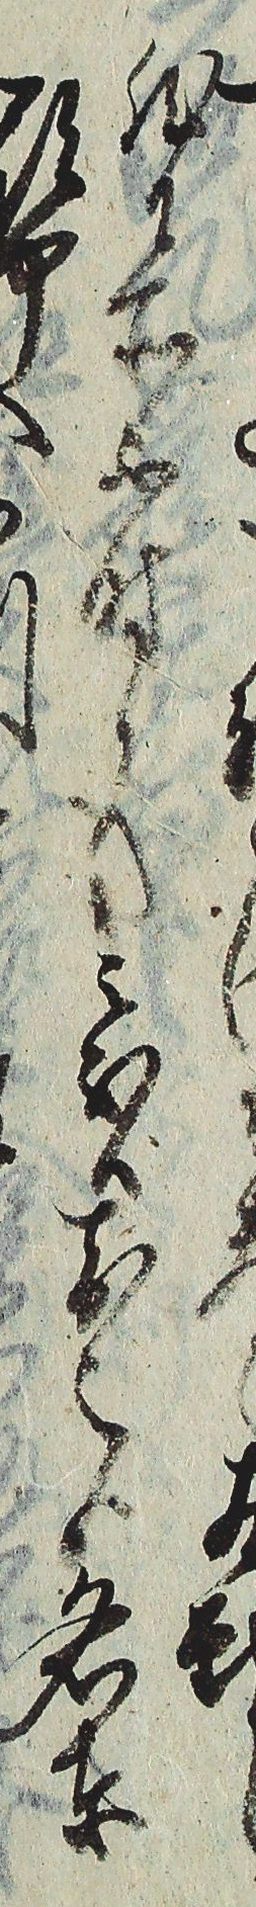然る所不時御用之義は前々ゟ名東
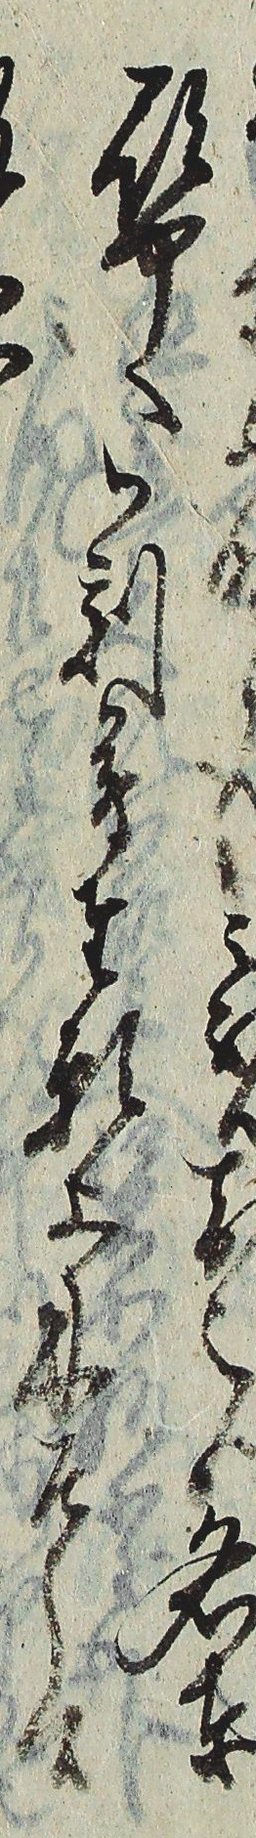郡中へ御割苻奉願上来居申候
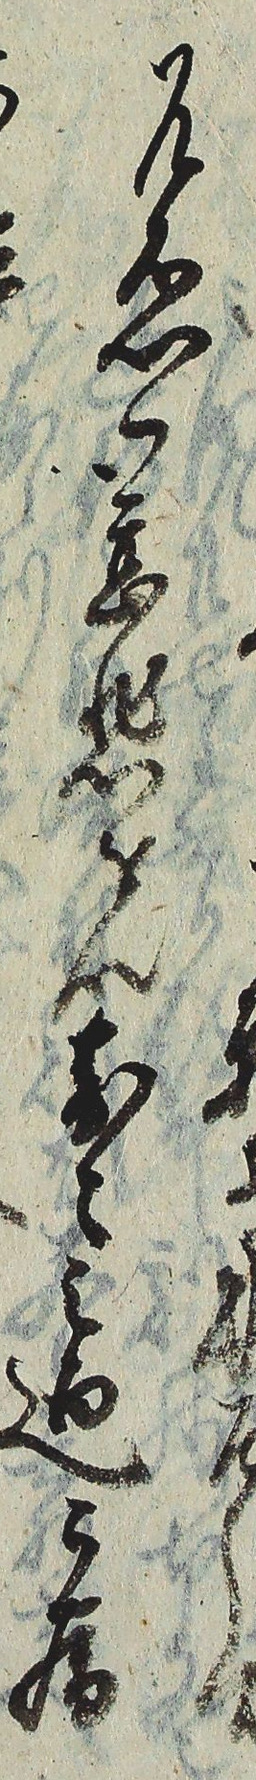乍恐御慈悲を以前々之通被為
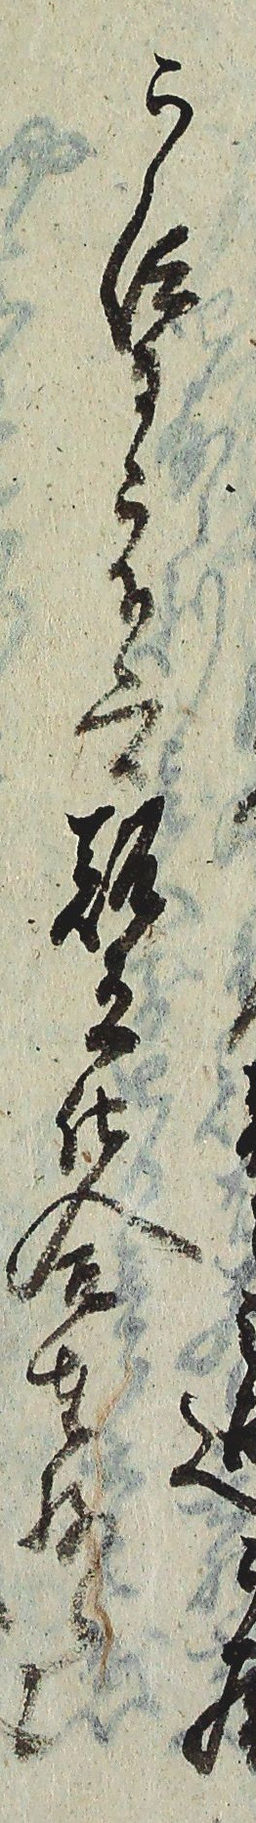被仰付被下候はゝ難有仕合奉存候以上
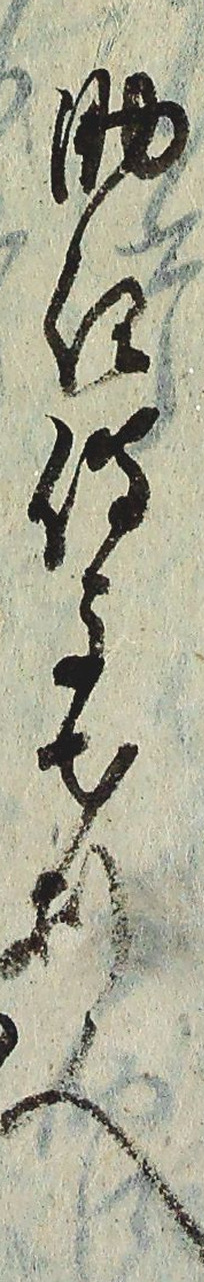助任伝馬才判人
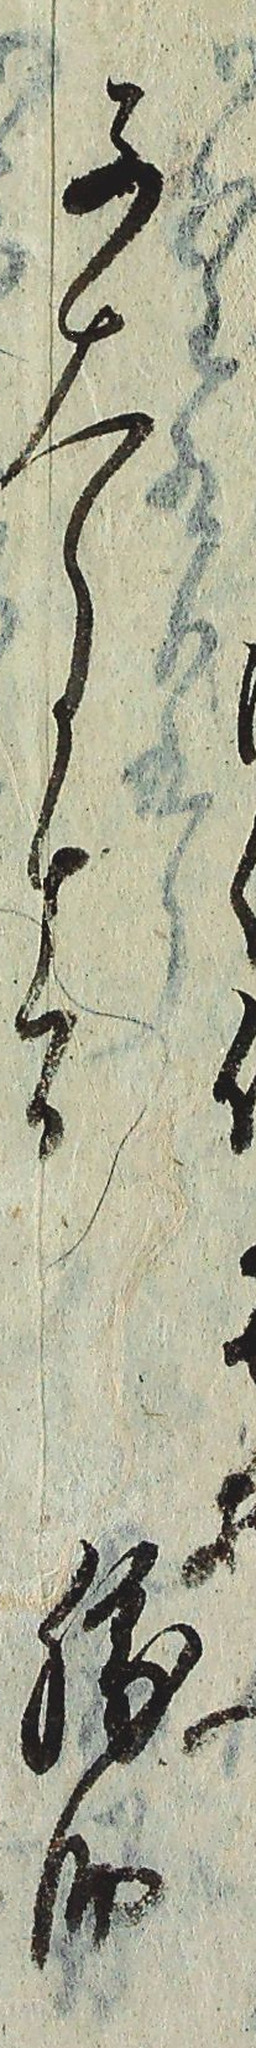子十一月十一日勝助
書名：名東郡中諸割賦元帳
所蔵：鳴門教育大学 Naruto University of Education
